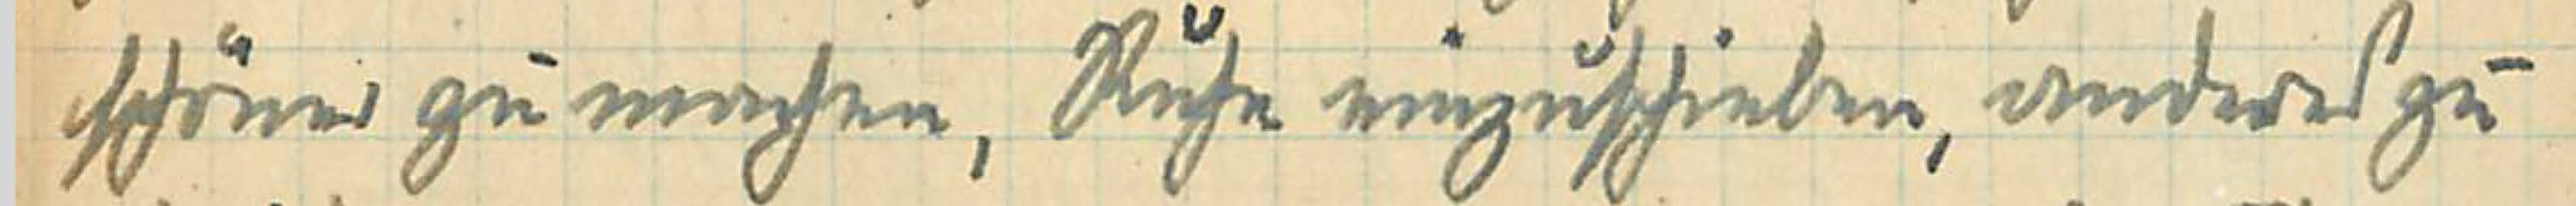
schöner zu machen, Ruhe einzuschieben, anderes zu
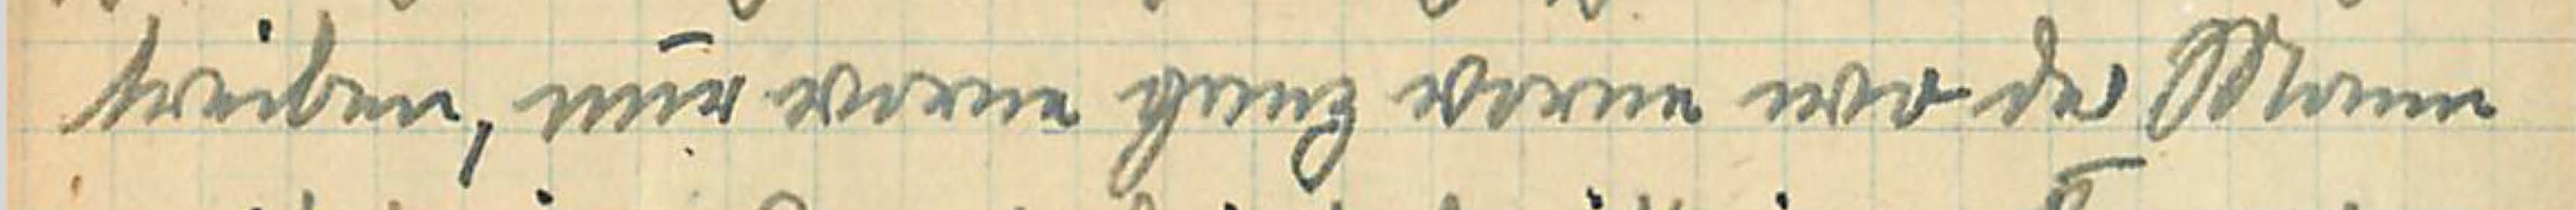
treiben, nur vorne ganz vorne wo der Mann
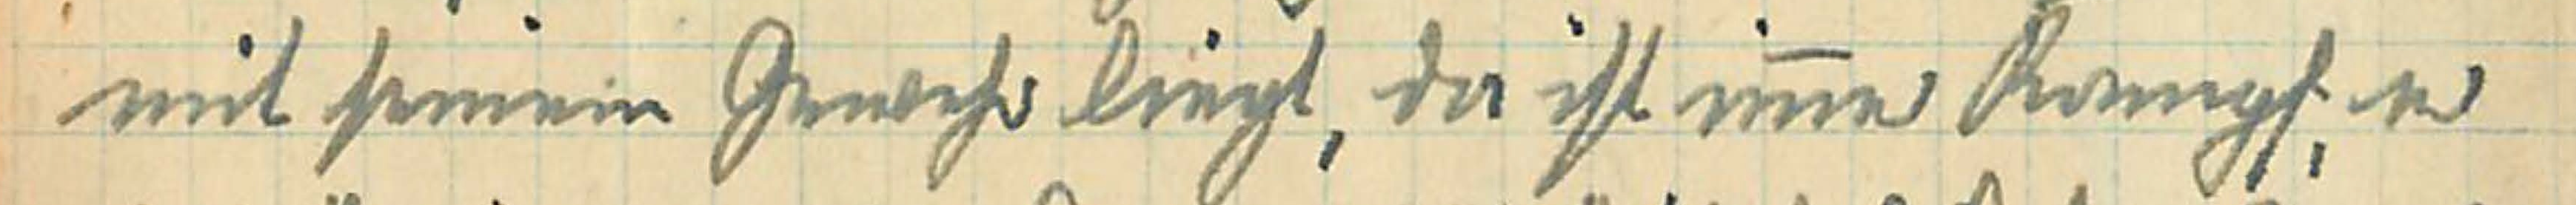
mit seinem Gewehr liegt, da ist immer Kampf, er
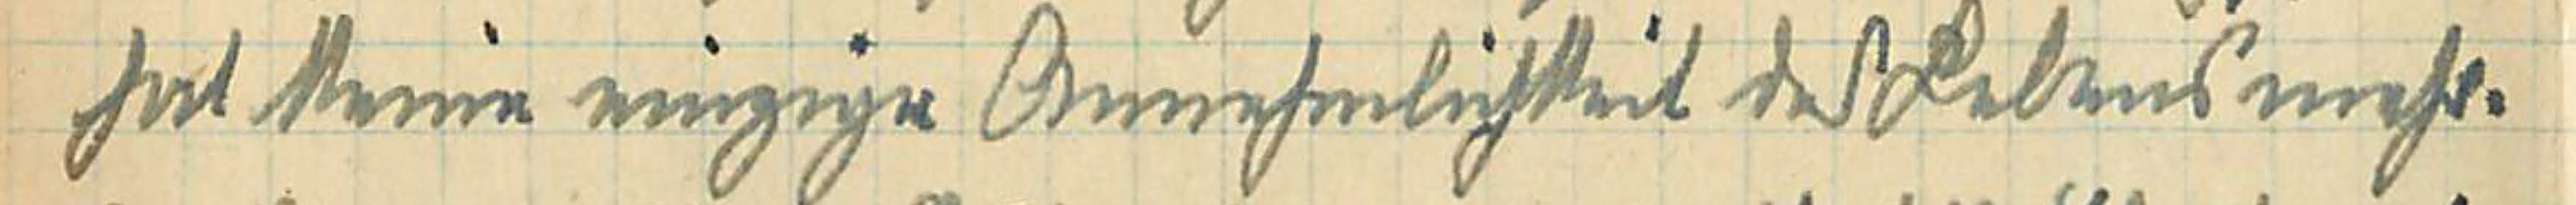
hat keine einzige Annehmlichkeit des Lebens mehr.
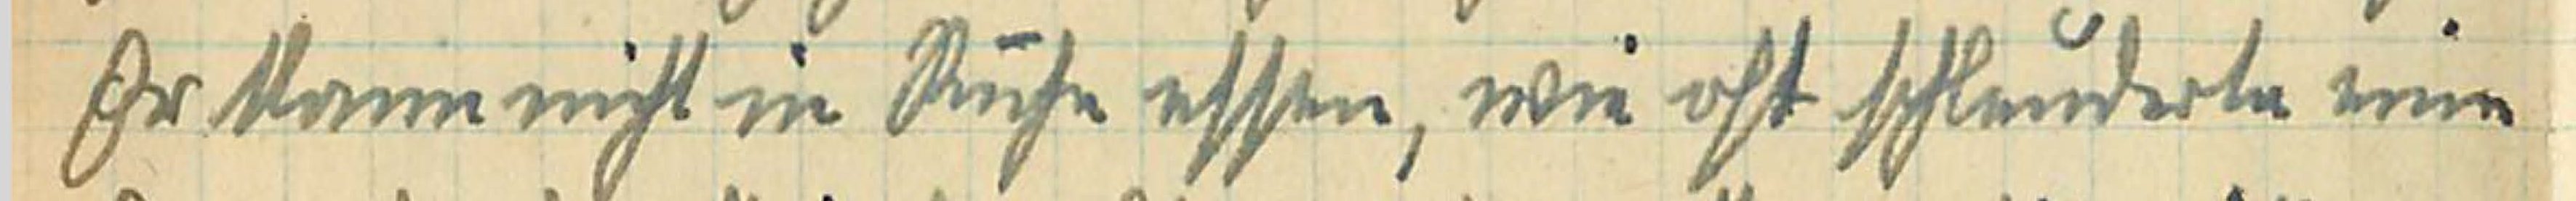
Er kann nicht in Ruhe essen, wie oft schleuderte eine
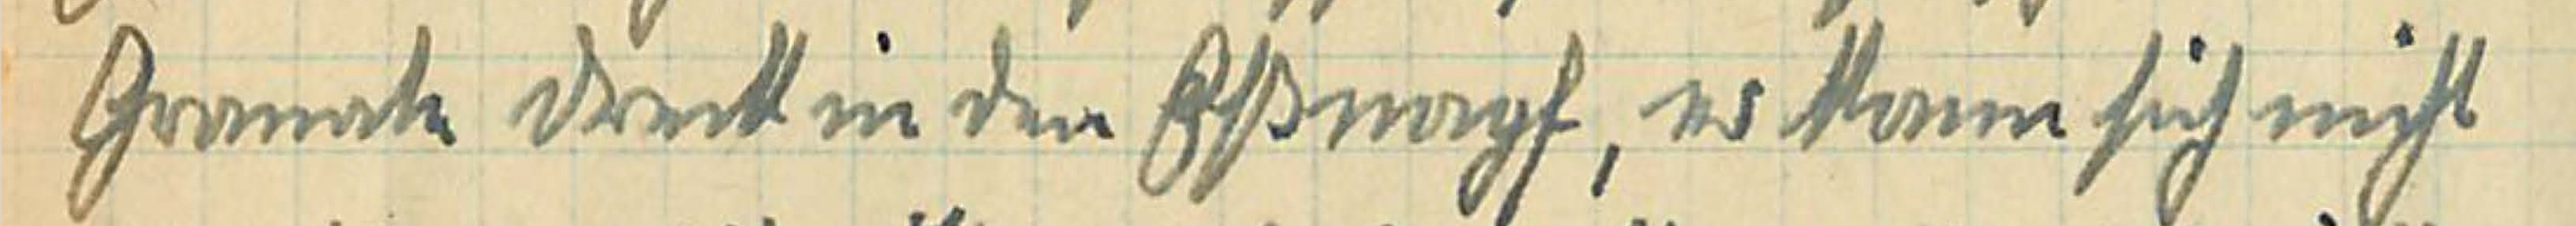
Granate Dreck in den Eßnapf, er kann sich nicht
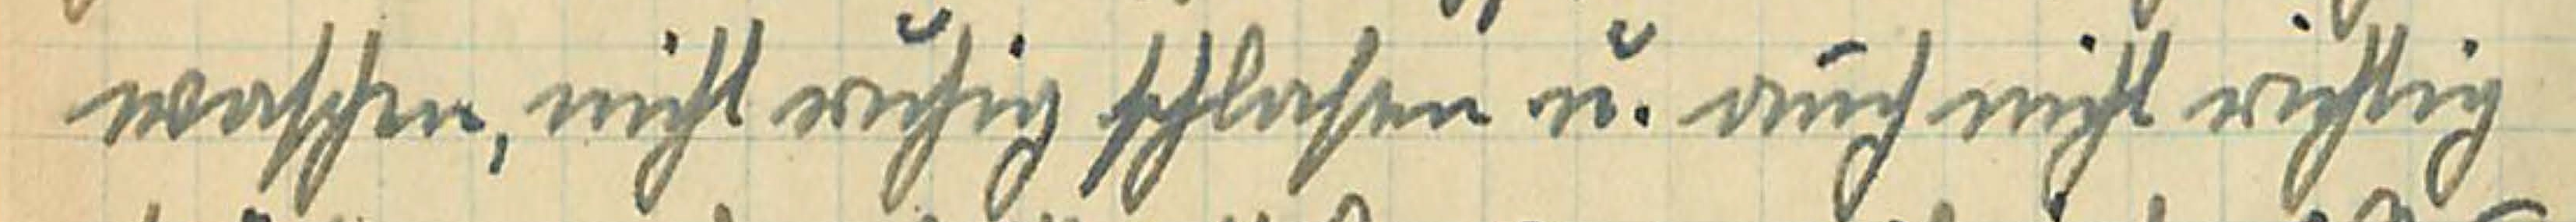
waschen, nicht ruhig schlafen u. auch nicht richtig
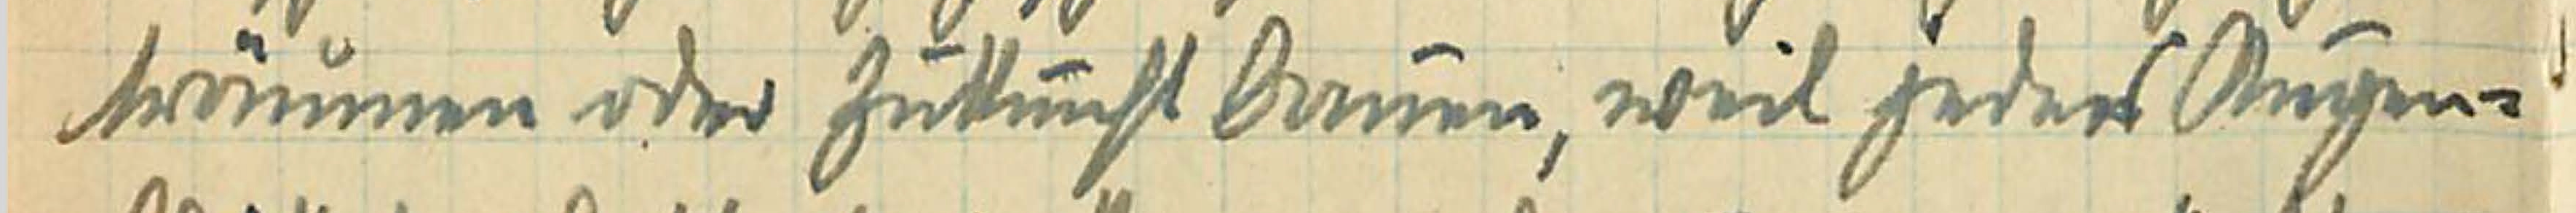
träumen oder Zukunft bauen, weil jeder Augen-
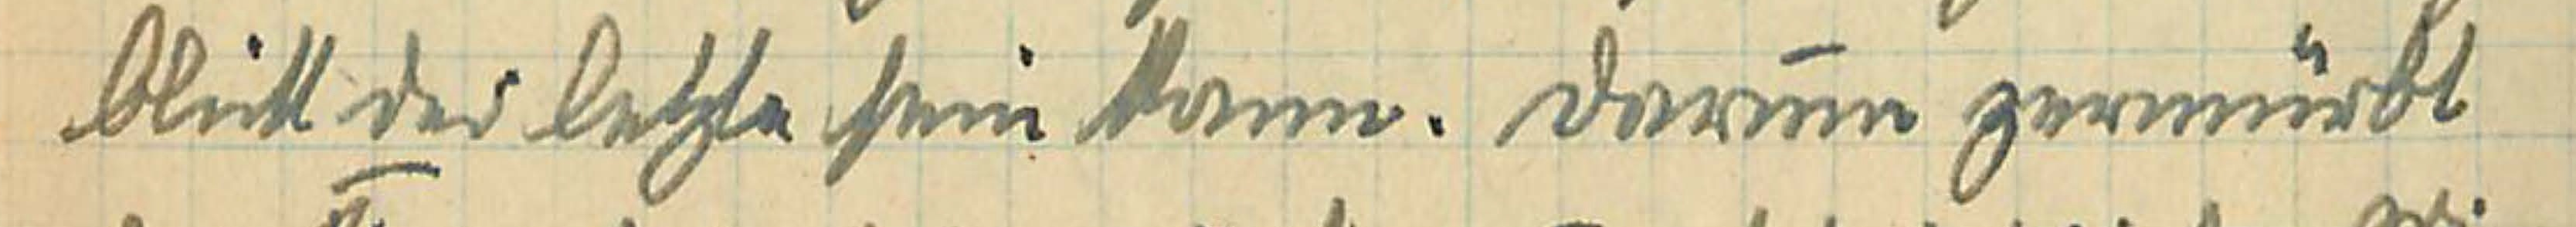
blick der letzte sein kann. Darum zermürbt
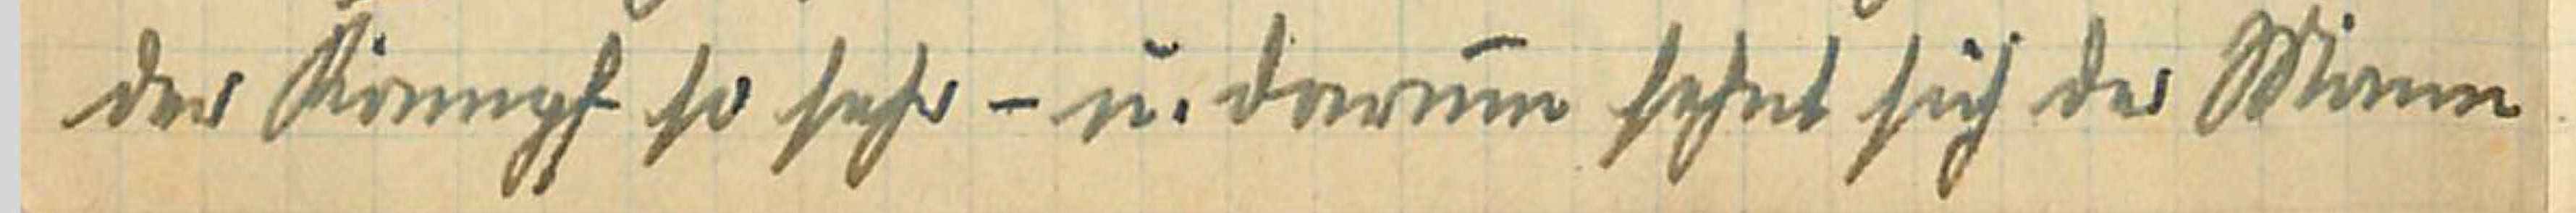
der Kampf so sehr – u. darum sehnt sich der Mann
